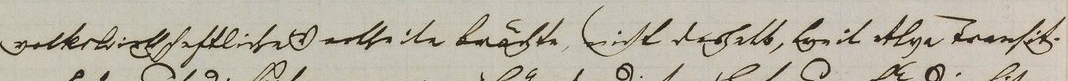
volkswirthschaftliche Vortheile brächte, nicht deshalb, weil etwa Transit-
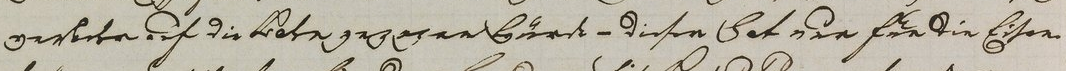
verkehr auf die Bahn gezogen würde – dieser hat nur für die Eisen-
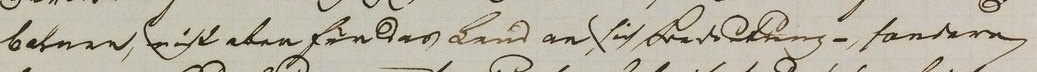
bahnen, nicht aber für das Land an sich Bedeutung –, sondern
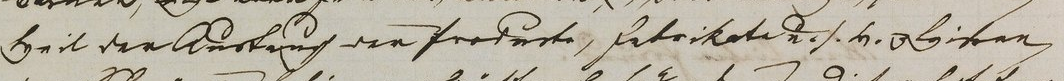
weil der Austausch der Produkte, Fabrikate u. s. w. zwischen
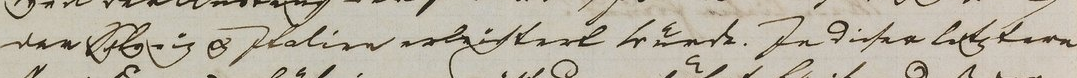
der Schweiz & Italien erleichtert würde. In dieser letztern
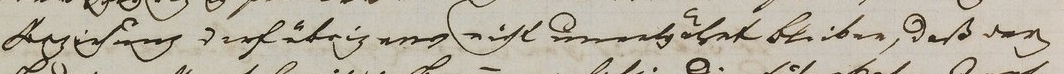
Beziehung darf übrigens nicht unerwähnt bleiben, daß der
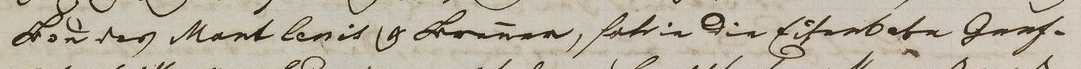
Bau des Mont Cenis & Brenner, sowie die Eisenbahn Genf–
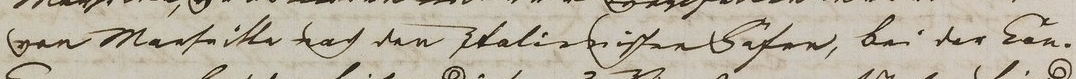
von Marseille nach den Italienischen Häfen, bei der Con-
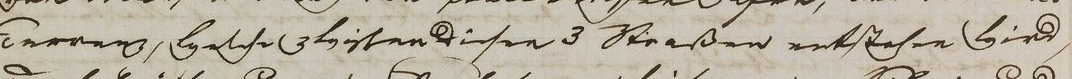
currenz, welche zwischen diesen 3 Straßen entstehen wird,
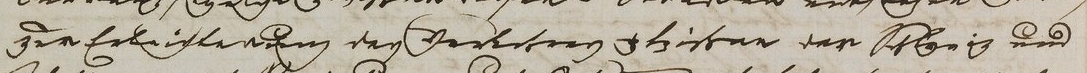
zur Erleichterung des Verkehres zwischen der Schweiz und
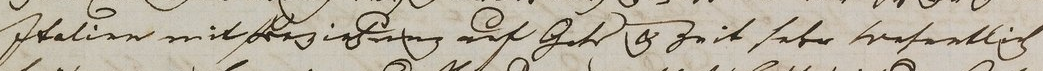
Italien mit Beziehung auf Geld & Zeit sehr wesentlich
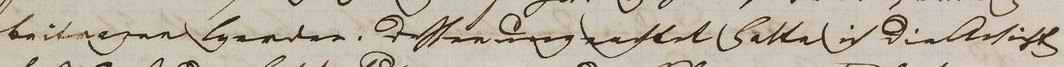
beitragen werden. Dessenungeachtet halte ich die Ansicht
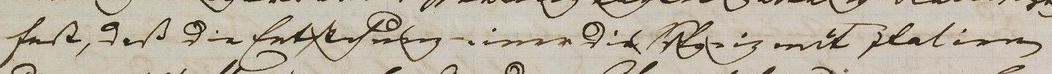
fest, daß die Entstehung einer die Schweiz mit Italien
